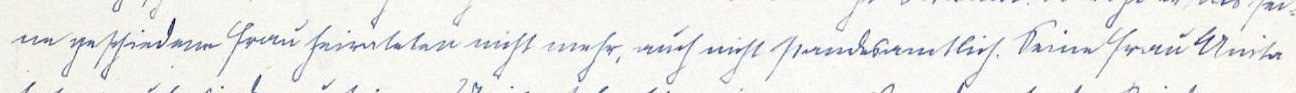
ne geschieden Frau heirateten nicht mehr, auch nicht standesamtlich. Seine Frau Anita
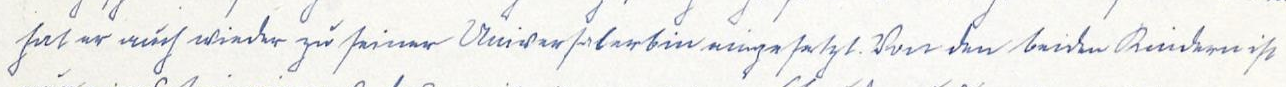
hat er auch wieder zu seiner Unversalerbin eingesetzt. Von den beiden Kindern ist
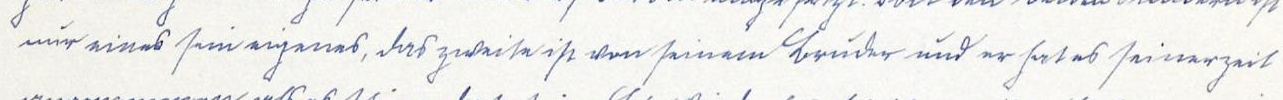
nur eines sein eigenes, das zweite ist von seinen Bruder und er hat es seinerzeit
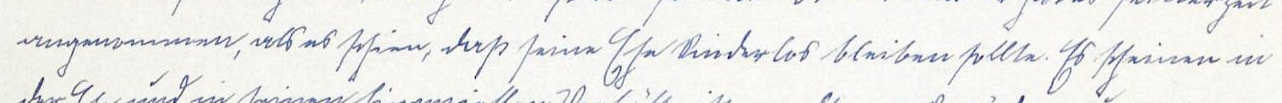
angenommen, als es schien, daß seine Ehe kinderlos bleiben sollte. Es scheinen in
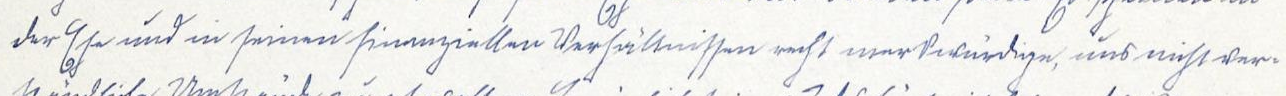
der Ehe und in seinen finanziellen Verhältnissen recht merkwürdige, uns nicht ver-
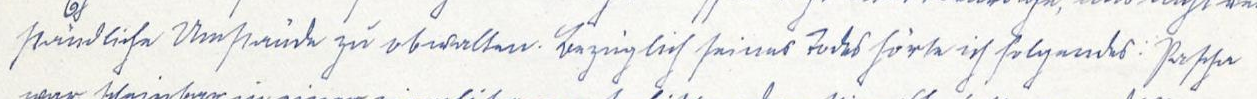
ständliche Unstände zu obwalten bezüglich seines Todes hörte ich folgendes: Pascha
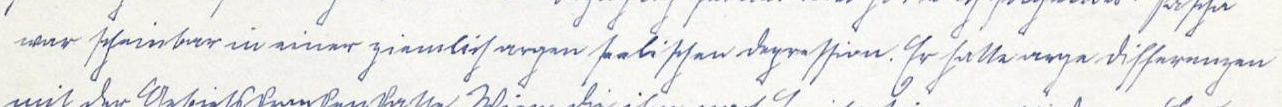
war scheinbar in einer ziemlich argen seelischen Depression. Er hatte arge differenzen
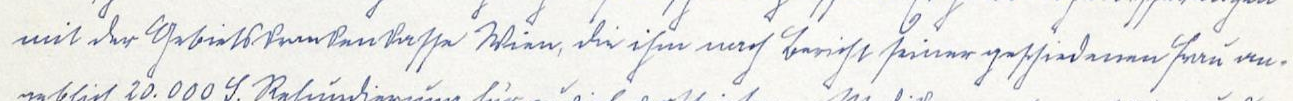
mit der Gebietskrankenkasse Wien, die ihm nach Bericht seiner geschiedenen Frau an-
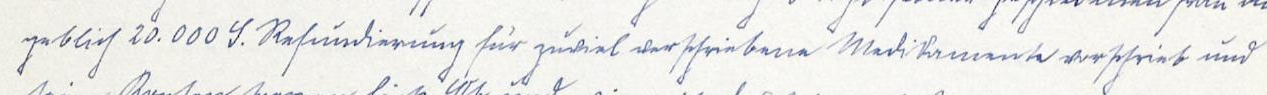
geblich 20.000 S Refundierung für zuviel verschriebene Medikamente vorschrieb und
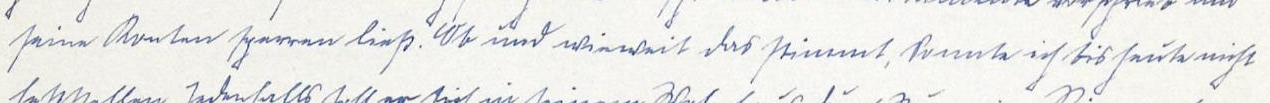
seine Konten sperren ließ. Ob und wieweit das stimmt, konnte ich bis heute nicht
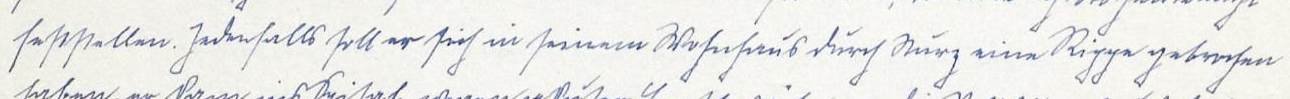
feststellen. Jedenfalls soll er sich in seinem Wohnfaus durch Sturz eine Rippe gebrochen
